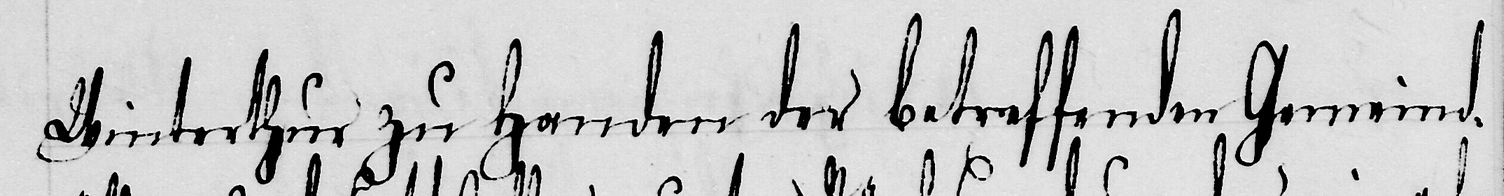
Winterthur zu Handen der betreffenden Gemeind¬
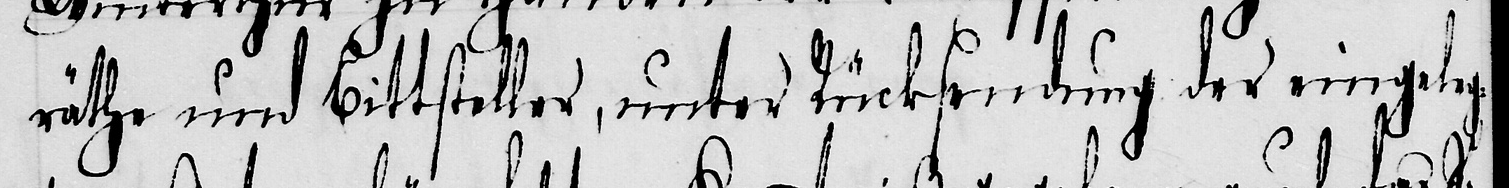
räthe und Bittsteller, unter Rücksendung der eingele¬
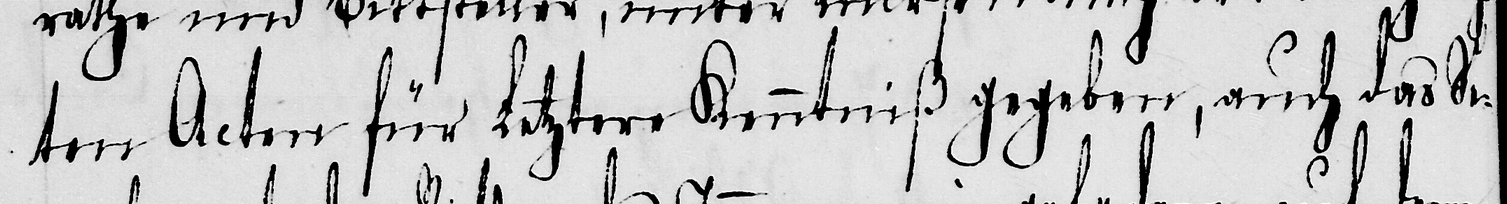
gten Acten für Letztere Kenntniß gegeben, auch das S¬
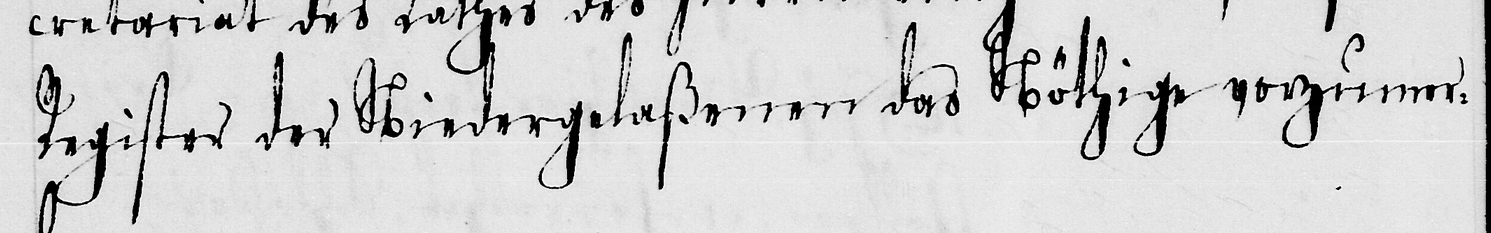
Register der Niedergelassenen das Nöthige vorzumer¬
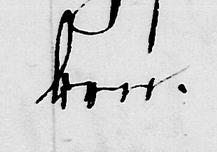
ten
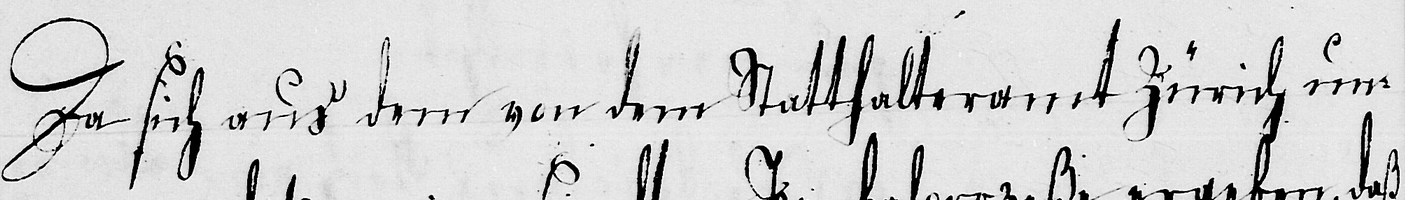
Da sich aus dem von dem Statthalteramt Zürich un¬
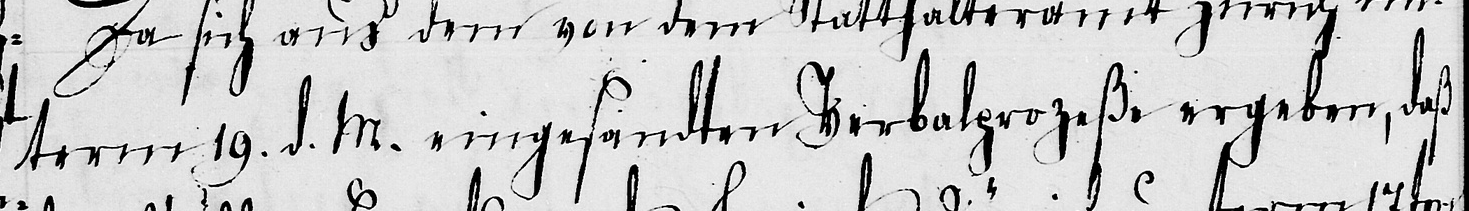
term 19. d. M. eingesandten Verbalprozeße ergeben, daß
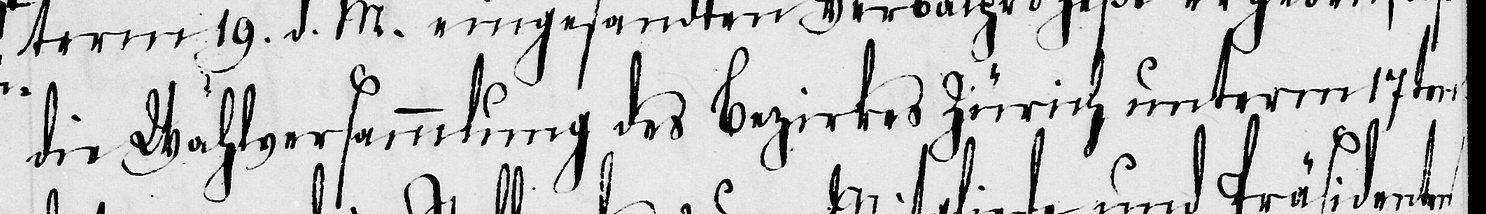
die Wahlversammlung des Bezirkes Zürich unterm 17ten
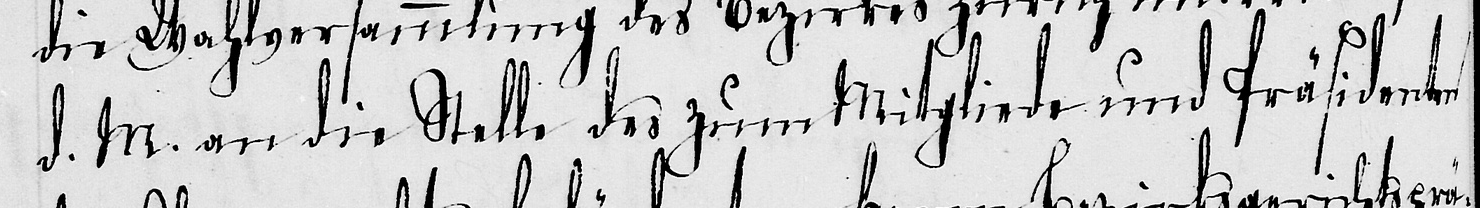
d. M. an die Stelle des zum Mitgliede und Präsiden¬
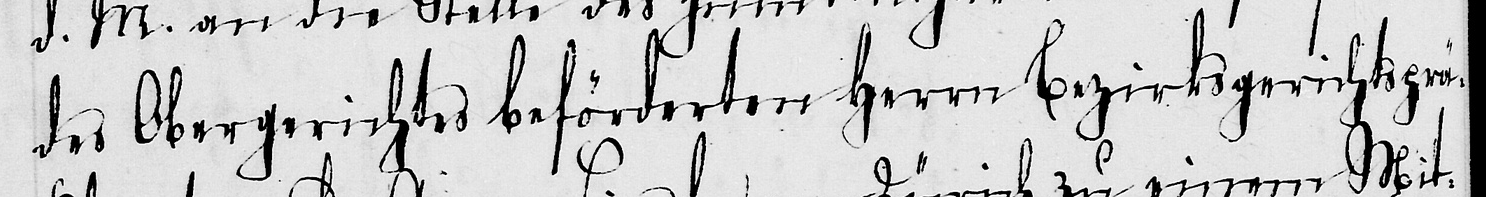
des Obergerichtes beförderten Herrn Bezirksgerichtsprä¬
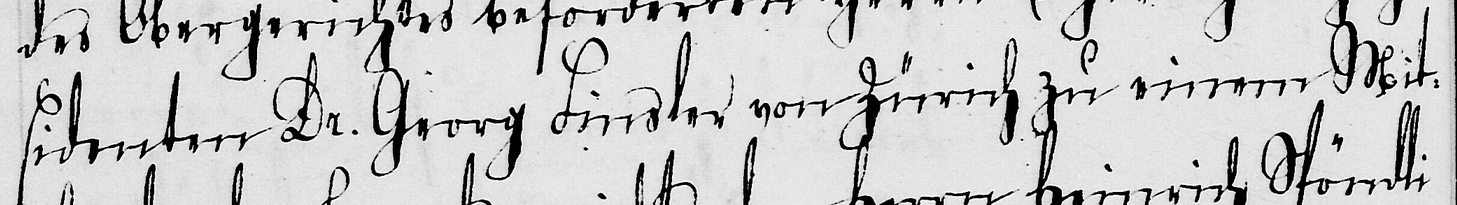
sidenten Dr. Georg Finsler von Zürich zu einem Mit¬
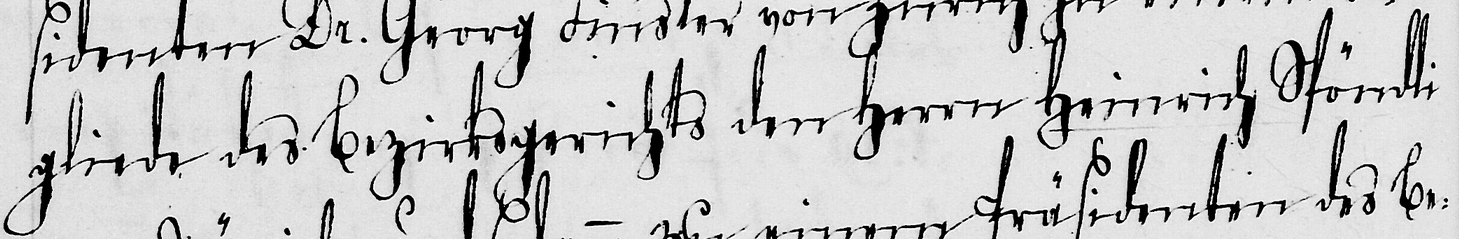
gliede des Bezirksgerichts den Herrn Heinrich Spöndli
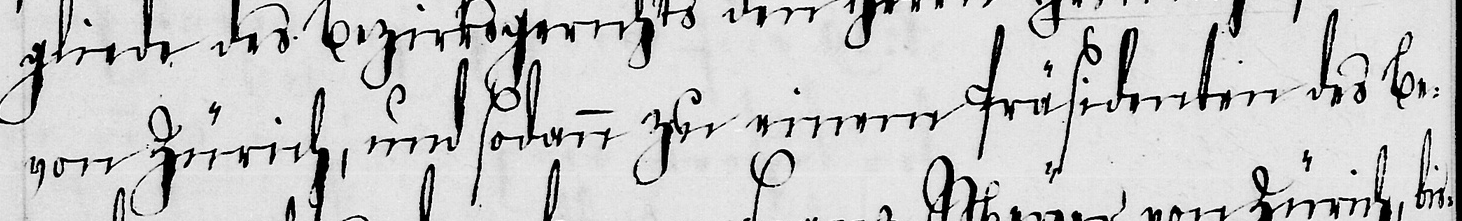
von Zürich, und sodann zu einem Präsidenten des Be¬
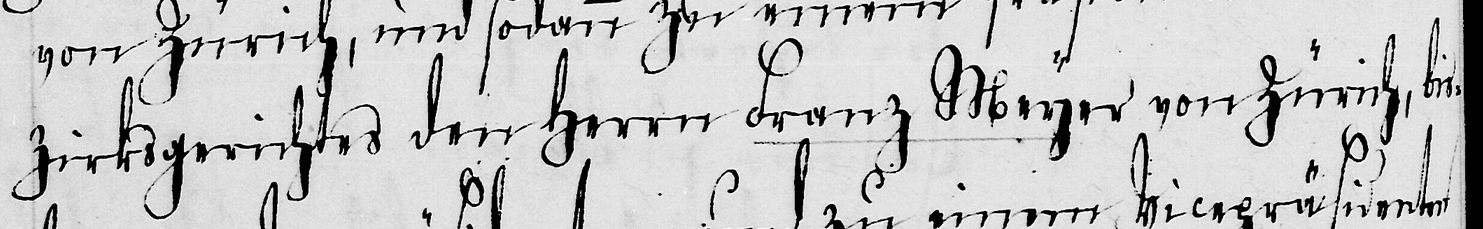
zirksgerichtes den Herrn Franz Meyer von Zürich, bi¬
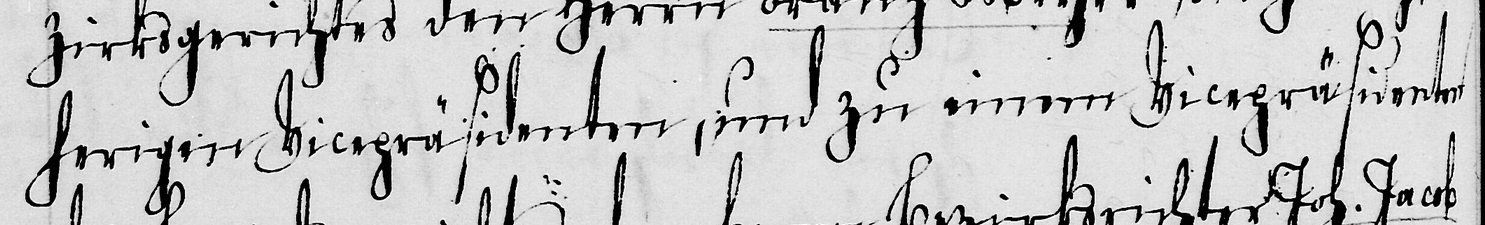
sherigen Vicepräsidenten, und zu einem Vicepräsiden¬
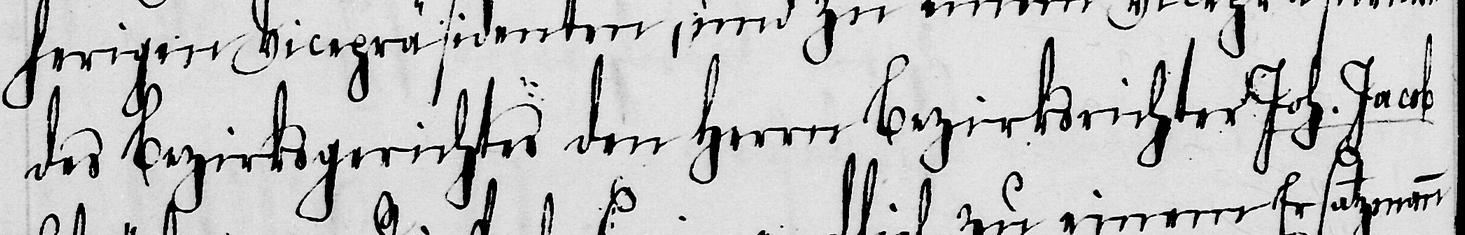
des Bezirksgerichtes den Herrn Bezirksrichter Joh. Jac¬
